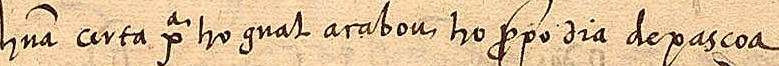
hūa certa pa ho qual acabou ho ꝓp̄o dia de pascoa
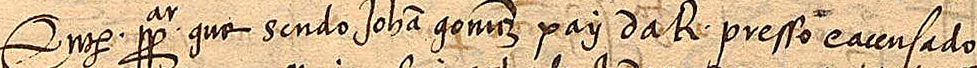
Entꝭ. ꝑꝑar. que sendo Johā gomez pay da R. presso e accusado
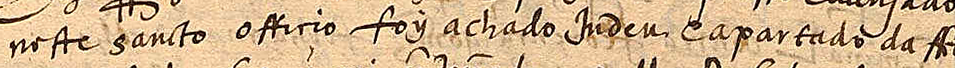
neste sancto offiçio foy achado Judeu e apartado da ffee
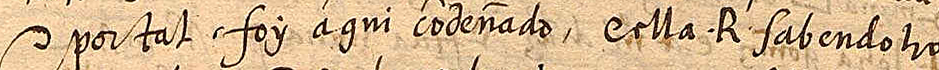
e por tal foy aqui cōdenado, e ella .R. sabendo ho
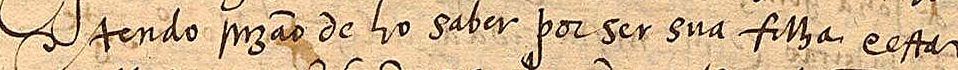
e tendo rezão de ho saber por ser sua filha e estar
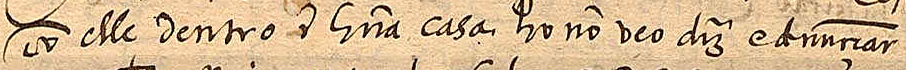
c̄o elle dentro ē hūa casa ho nō veo diz̄ e denūçiar
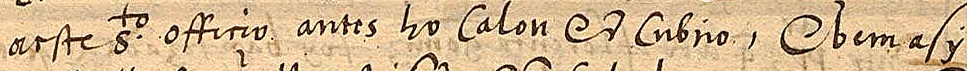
a este S.to offiçio antes ho Calou e ēCubrio , e bem asy
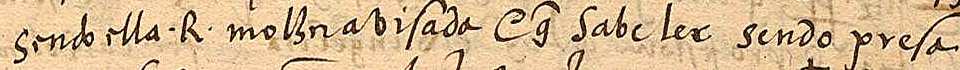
sendo ella .R. molher avisada e q̄ sabe ler sendo presa
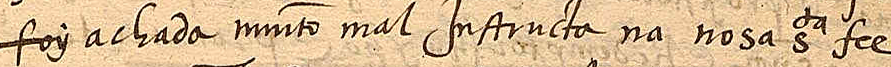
foy achada muito mal Jnstructa na nosa sta fee
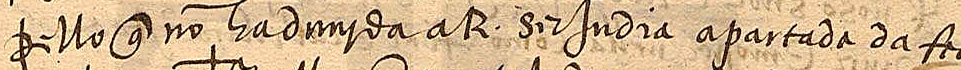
pello q̄ nō ha duujda a R. ser Judia apartada da fee
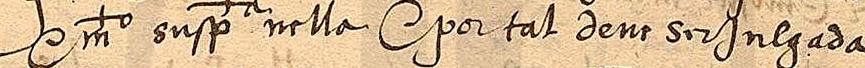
e mto suspta nella e por tal deue ser Julgada
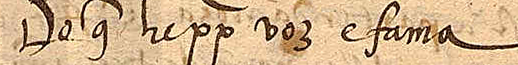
Do q̄ he ppCa voz e fama
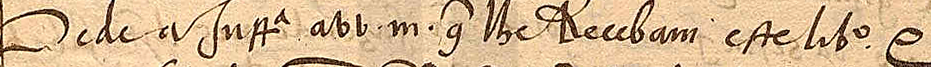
Pede a Justa a vv. m. q̄ lhe Recebam este libo. e
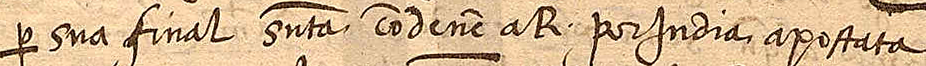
ꝑ sua final s̄nta c̄odenē a R. por Judia apostata
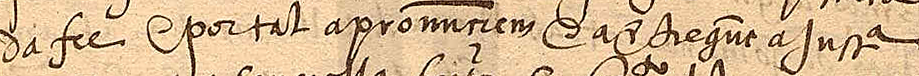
da fee e por tal a pron̄uçiem e a ētregūe a Justa
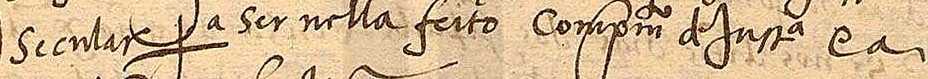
Secular ꝑa ser nella feito comp̄meto de Justa e a
